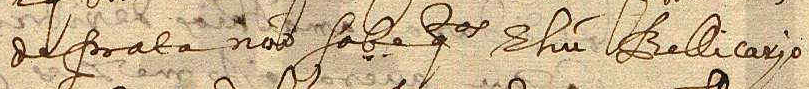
de prata nãoaõ sabe qatos E hū Rellicarjo
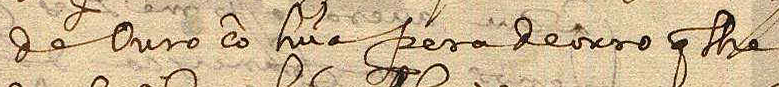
de Ouro cō huā pera de ouro q̄ lhe
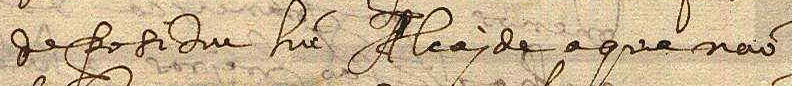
depositou hū Alcajde a que naõ
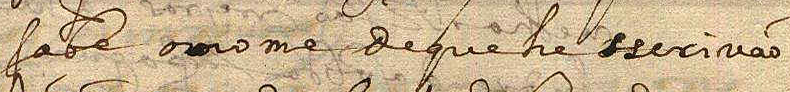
sabe o nome de que he Escriuaõ
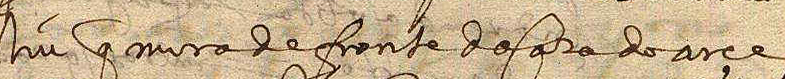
hū q̄ mora defronte da Caza do arce
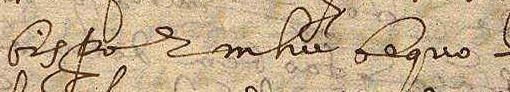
bispo Em hū bequo
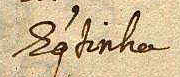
E q̄ tinha
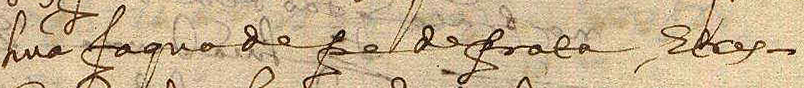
huā faqua de pe de prata, E tres
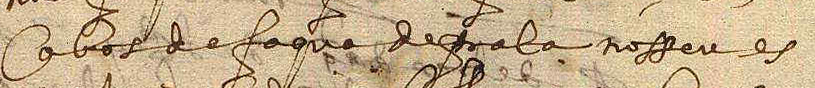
Cabos de faqua de prata no sseu es
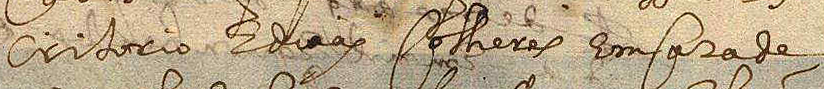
critorio E duas Colheres Em Caza de
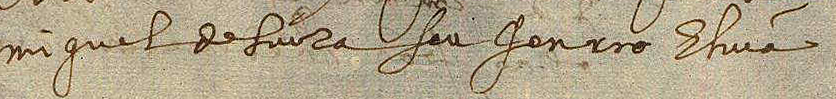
miguel de Souza seu Jenrro E huā
